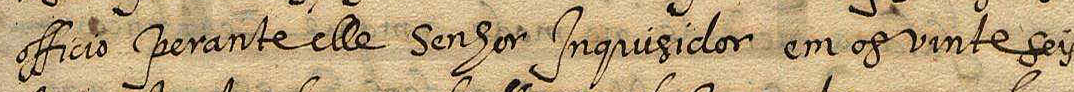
officio perante elle Senhor Jnquisidor em os vinte seis
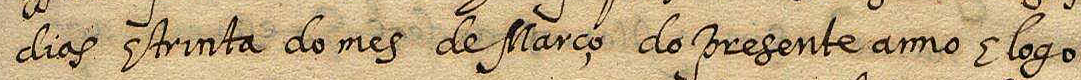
dias E trinta do mes de Março do presente anno E logo
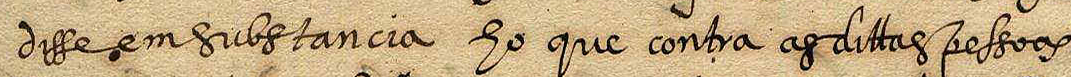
disse em substancia ho que contra as dittas pessoas
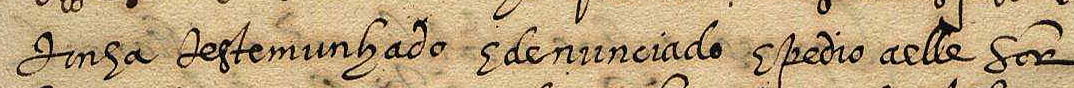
tinha testemunhado E denunciado E pedio a elle sōr
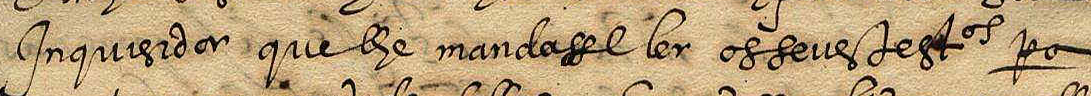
Jnquisidor que lhe mandasse ler os seus testos ꝑa
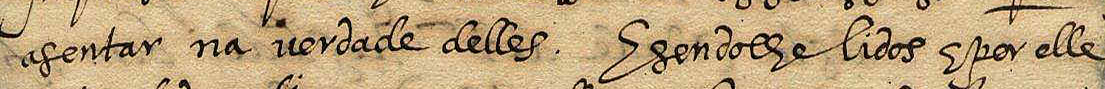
asentar na uerdade delles. E sendolhe lidos E por elle
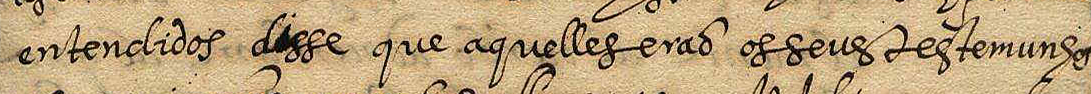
entendidos disse que aquelles eraõ os seus testemunhos
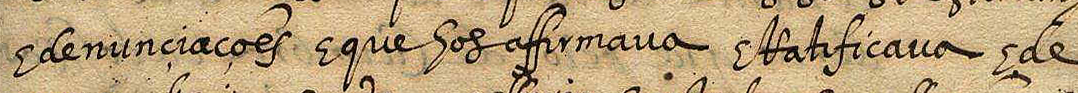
E denunciaçoẽs E que hos affirmaua E Ratificaua E de
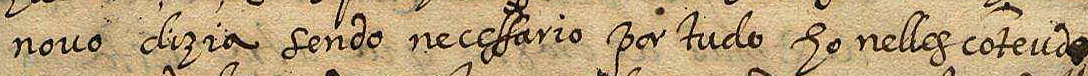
nouo dizia sendo necessario por tudo ho nelles cōteudo
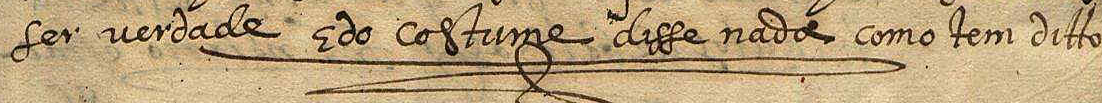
ser uerdade E do costume disse nada como tem ditto
